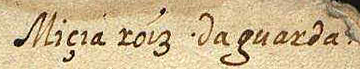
Miçia roīz. da guarda.
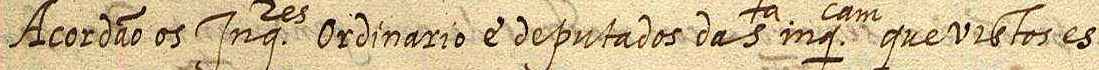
Acordão os Jnq.res Ordinario e deputados da sta inq.cam que vistos es
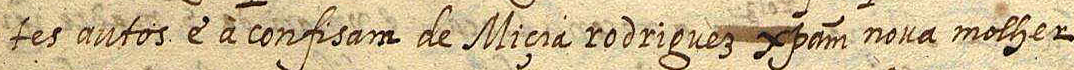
tes autos e a confisam de Miçia rodriguez xpam̄ noua molher
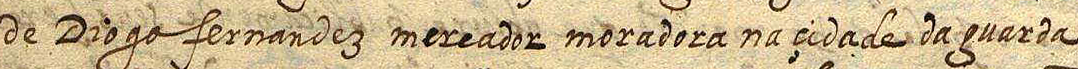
de Diogo fernandez mercador moradora na çidade da guarda
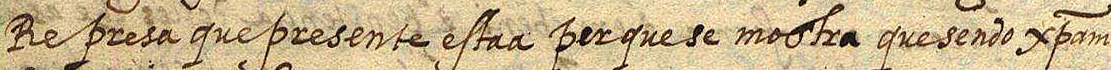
Re presa que presente estaa per que se mostra que sendo xpām
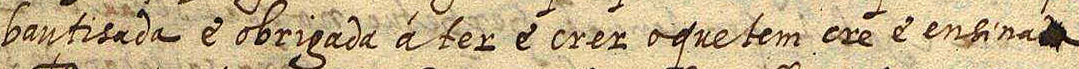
bautisada e obrigada á ter e crer o que tem cre e ensina
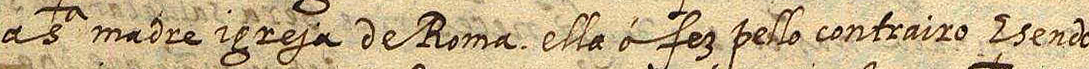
a sta madre igreja de Roma ella o fez pello contrairo E sendo
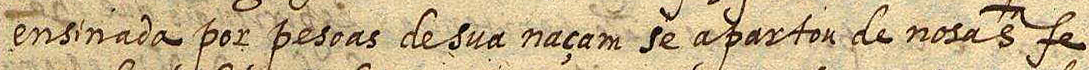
ensinada por pesoas de sua naçam se apartou de nosa sta fe
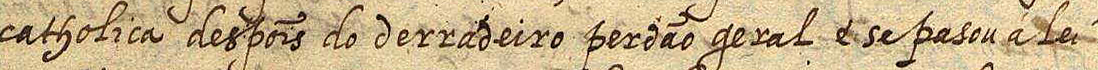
catholica despoīs do derradeiro perdão geral e se pasou á lei
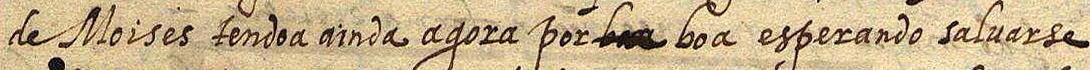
de Moises tendoa ainda agora por boa boa esperando saluarse
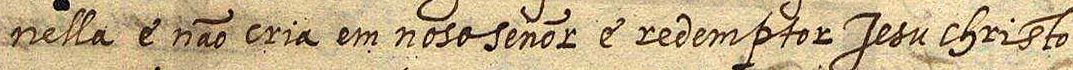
nella e não cria em noso senōr e redemptor Jesu christo
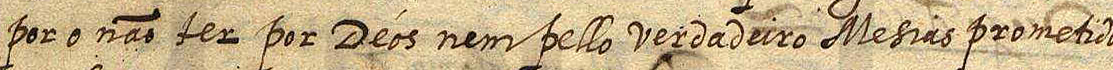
por o não ter por Deos nem pello verdadeiro Mesias prometido
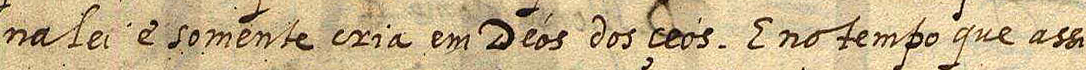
na lei e somente cria em Deos dos çeos. E no tempo que assi
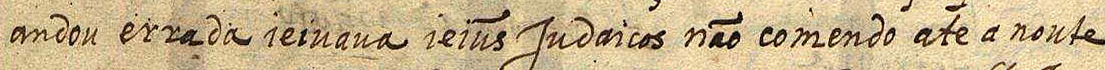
andou errada ieiuaua ieiūs Judaicos não comendo ate a noute
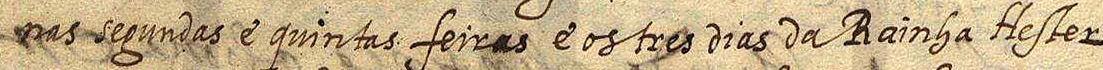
nas segundas e quintas feiras e os tres dias da Rainha Hester
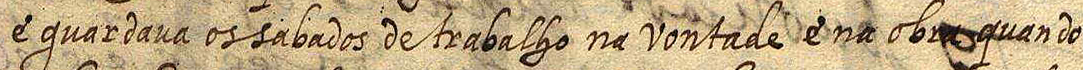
e guardaua os sabados de trabalho na vontade e na obra quando
